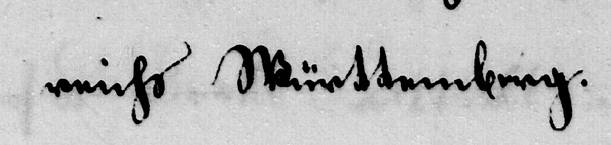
reichs Württemberg.
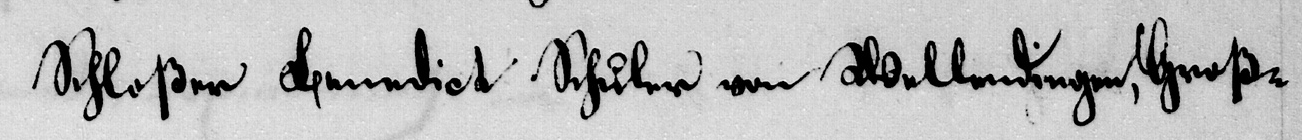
Schloßer Benedict Schuler von Wellendingen, Groß¬
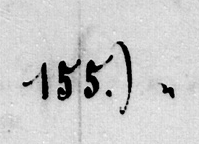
158.) “
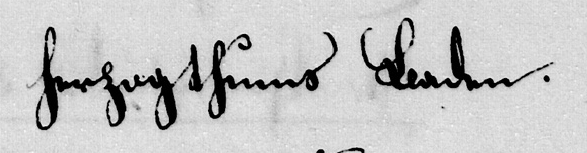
herzogthums Baden.
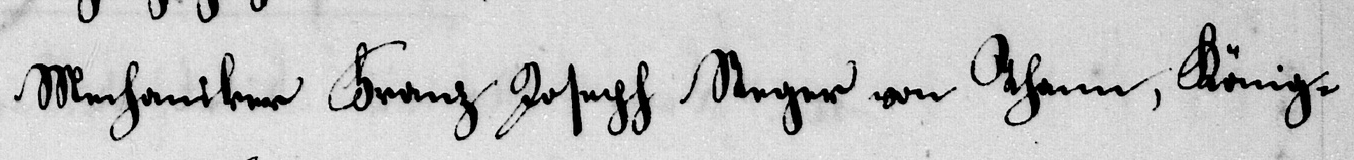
Mechaniker Franz Joseph Steger von Thann, König¬
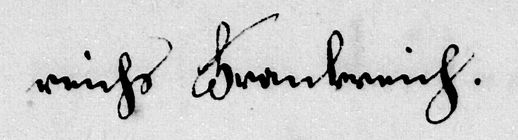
reichs Frankreich.
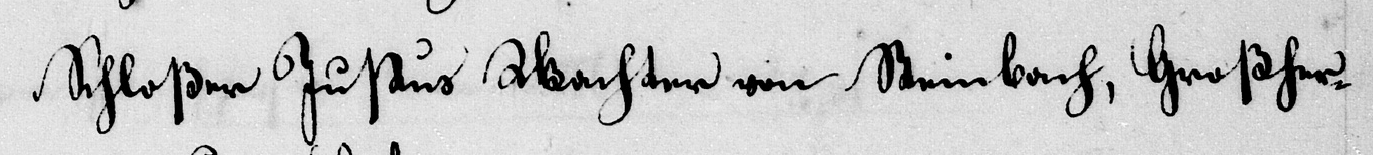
Schloßer Justus Wachter von Steinbach, Großher¬
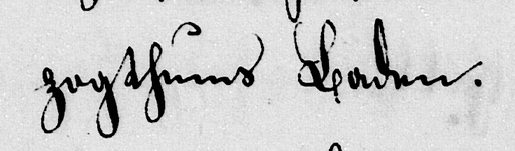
zogthums Baden.
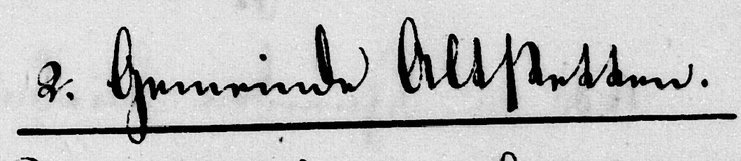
2. Gemeinde Altstetten.
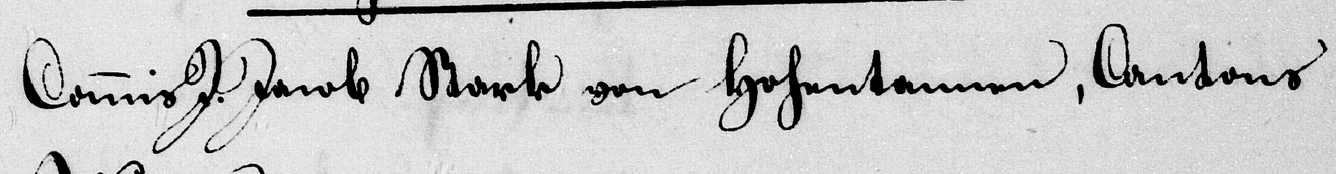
Commis J. Jacob Stark von Hohentannen, Cantons
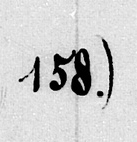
154.)
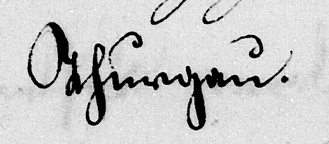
Thurgau.
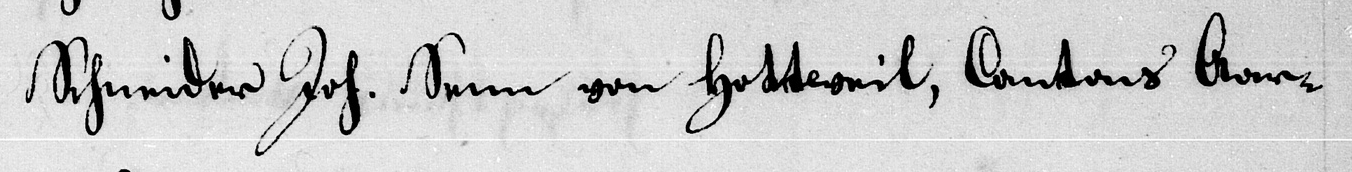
Schneider Joh. Senn von Hottweil, Cantons Aar¬
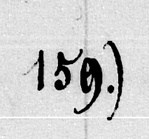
159.)
